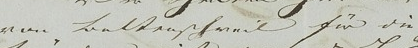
von Baltenschweil für die
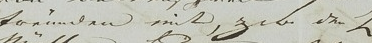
Freunden mit, z. B. den Herrn
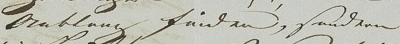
Anklang finden, sondern
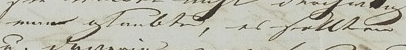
man glaubte, es sollten
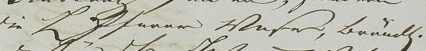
die Herren Pfarrer Waser, Brändli
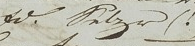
Ed. Sulzer
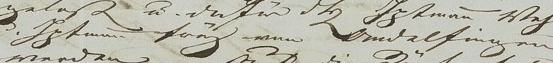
u. Hptmann Frey von Andelfingen
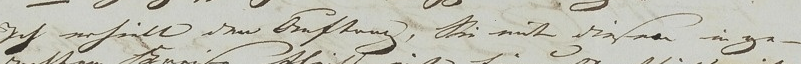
Ich erhielt den Auftrag, Sie mit diesen in ge-
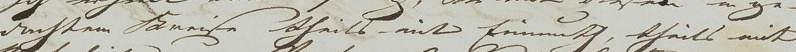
dachtem Kreise theils mit Einmuth, theils mit
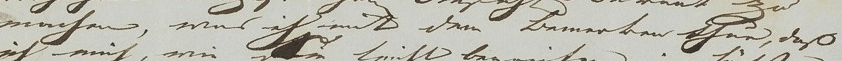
machen, was ich mit dem Bemerken thue, daß
